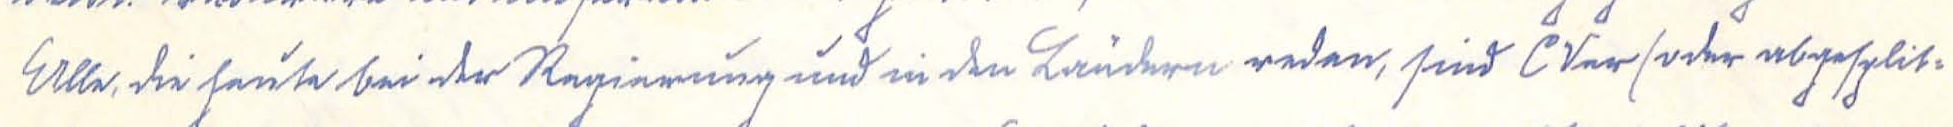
Alte, die heute bei der Regierung und in den Ländern reden, sind CVer (oder abgesplit-
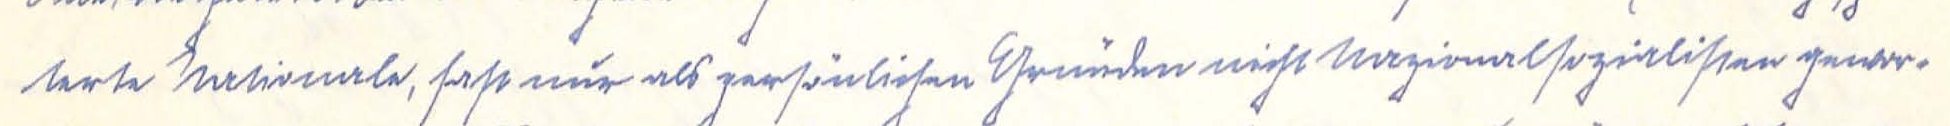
terte Nationale, fast nur aus persönlichen Gründen nicht Nazionalsozialisten gewor-
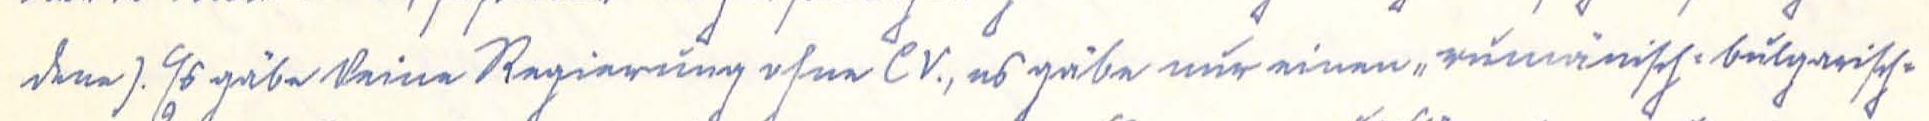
dem). Es gäbe keine Regierung ohne CV., es gäbe nur einen "rumänisch-bulgarisch-
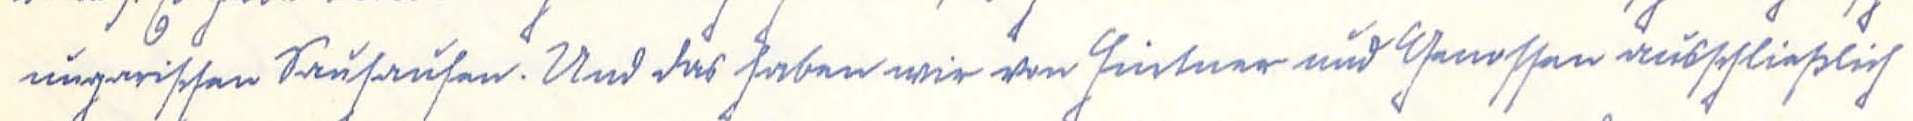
ungarischen Sauhaufen. Und das haben wir von Hintner und Genossen ausschließlich
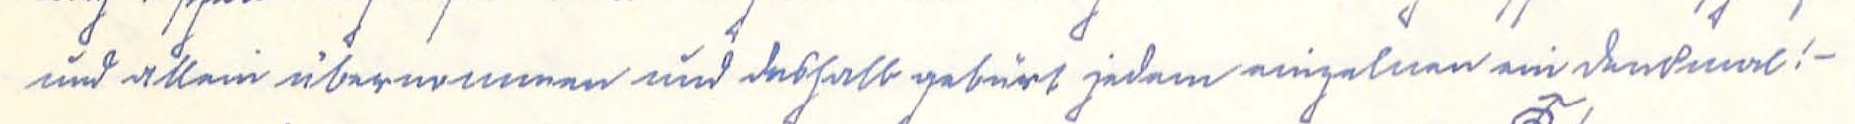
und allein übernommen und deshalb gebürt jedem einzelnen ein Dankwort!-
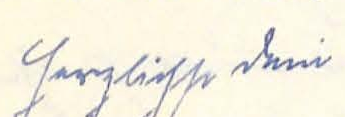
Herzlichst dein
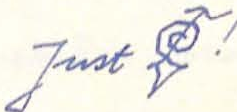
Just CI!
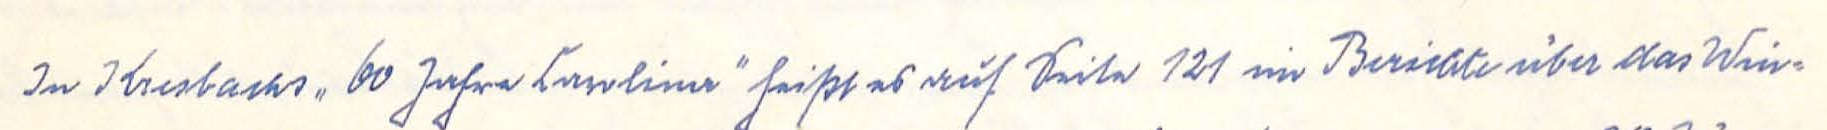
In Kresbachs "60 Jahre Carolina" heißt es auf Seite 121 im Berichte über das Win-
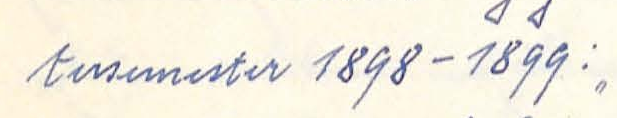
tersemester 1898-1899:
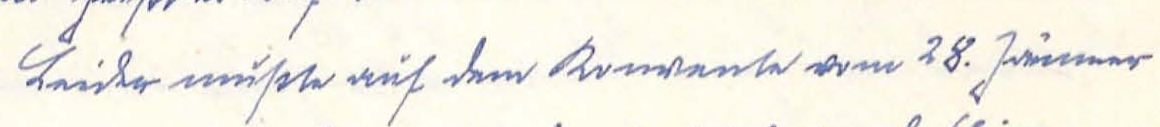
Leider mußte auf dem Konvente vom 28. Jänner
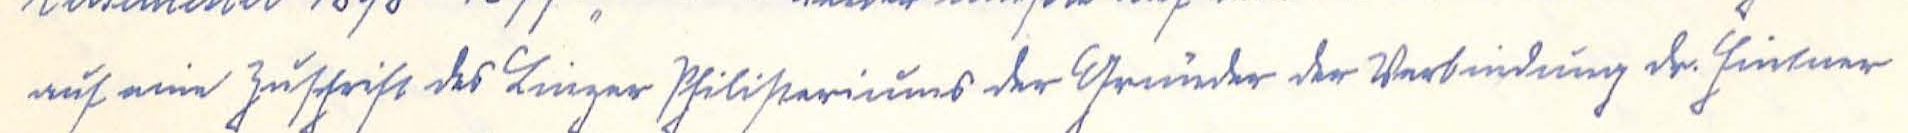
auf eine Zusschrift des Linzer Philisteriums der Gründer der Verbindung Dr. Hintner
